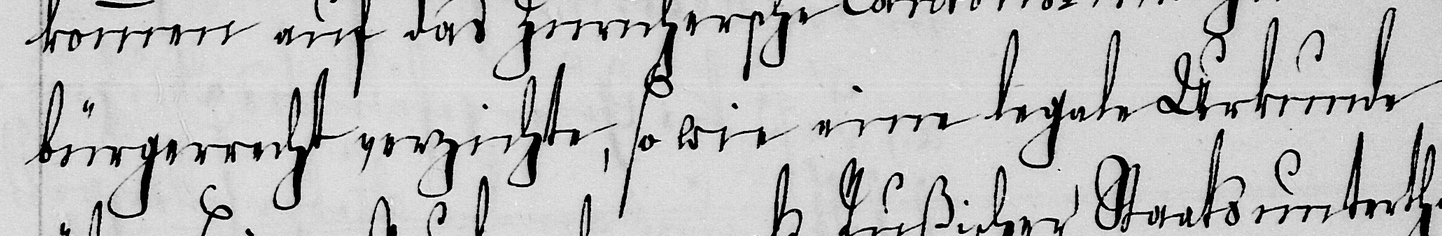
bürgerrecht verzichte, so wie eine legale Urkunde
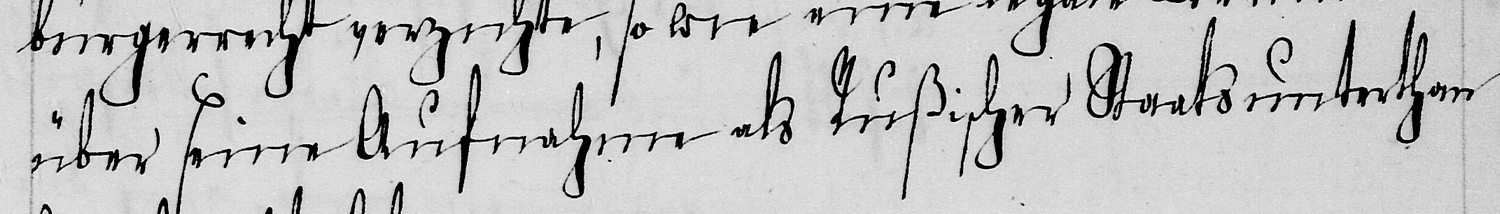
über seine Aufnahme als Rußischer Staatsunterthan
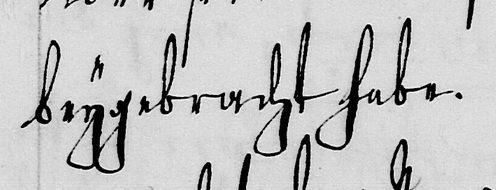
beygebracht habe.
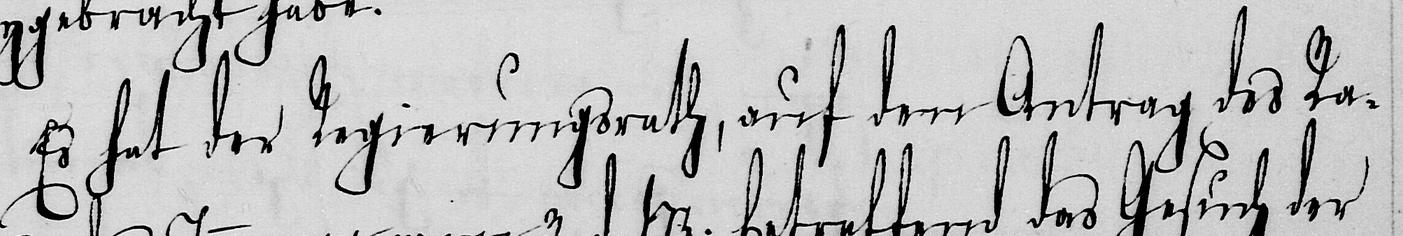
Es hat der Regierungsrath, auf Antrag des Ra¬
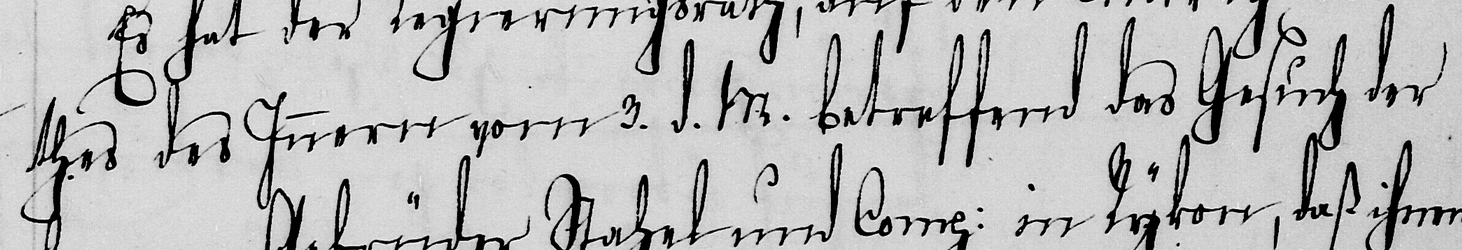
thes des Innern vom 3. d. M. betreffend das Gesuch der
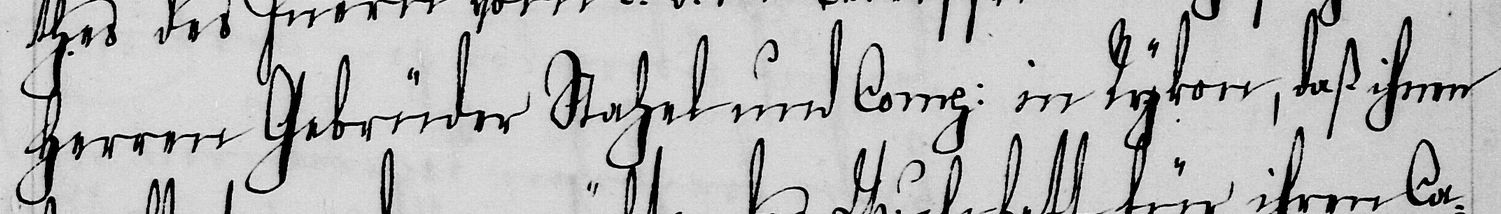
Herren Gebrüder Stahel und Comp: in Rykon, daß ihnen
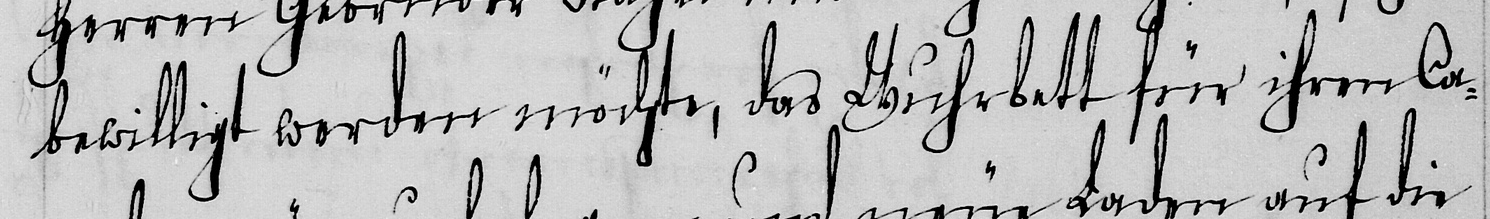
bewilligt werden möchte, das Wuhrbett für ihren Ca¬
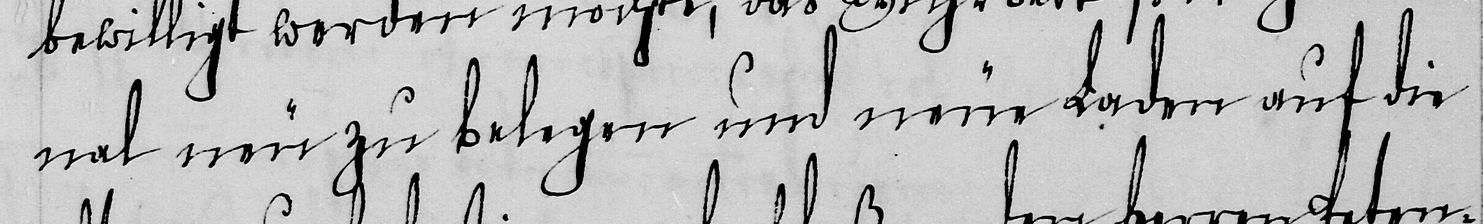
nal neu zu belegen und neue Laden auf die
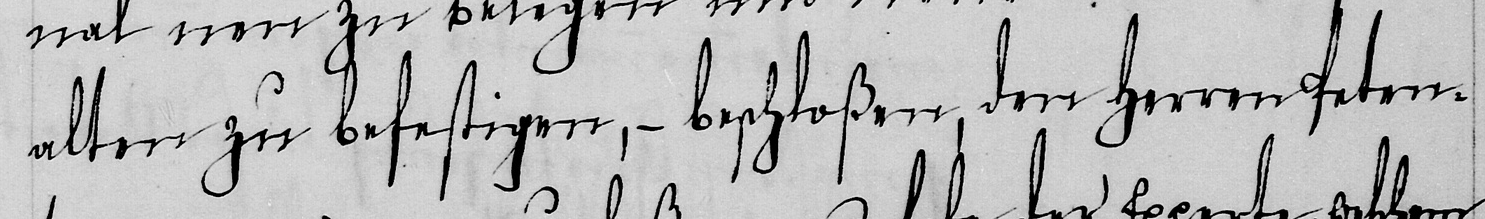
alten zu befestigen, – beschloßen, den Herren Peten¬
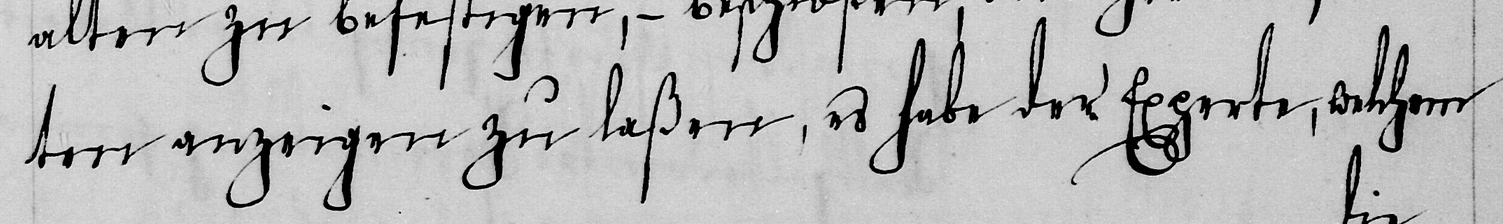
ten anzeigen zu laßen, es habe der Experte, welchen
